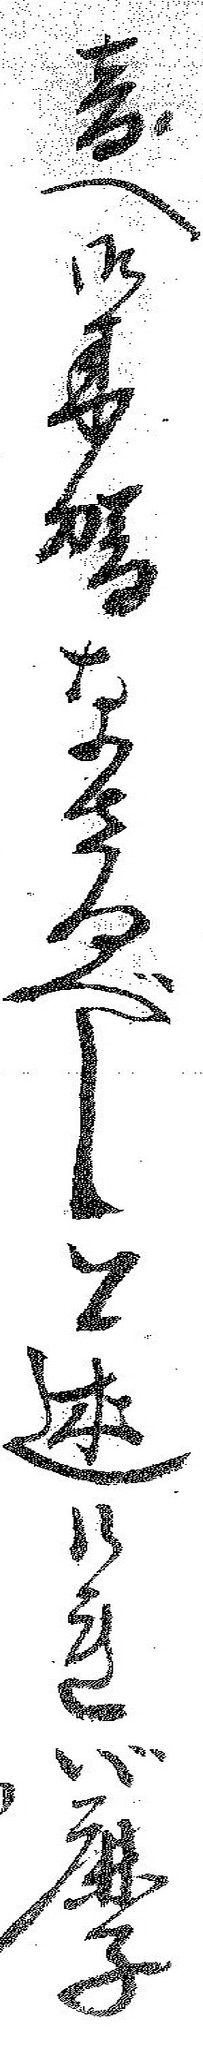音へ御来駕なさるべしと述ければ鹿子
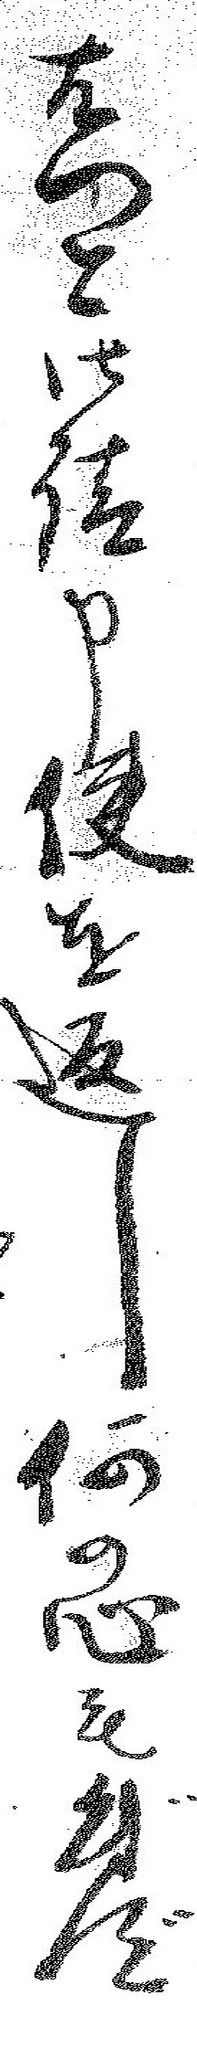はつと御請申使を返し何の心も付ず
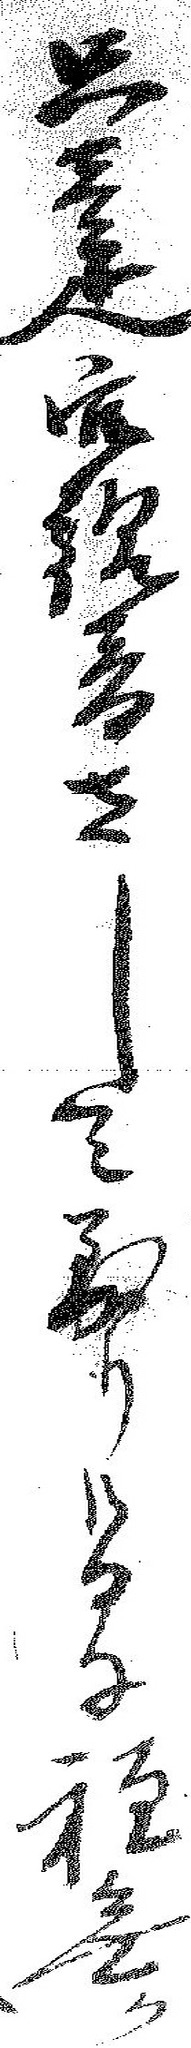只一疋穴観音さして至りけるに程無く
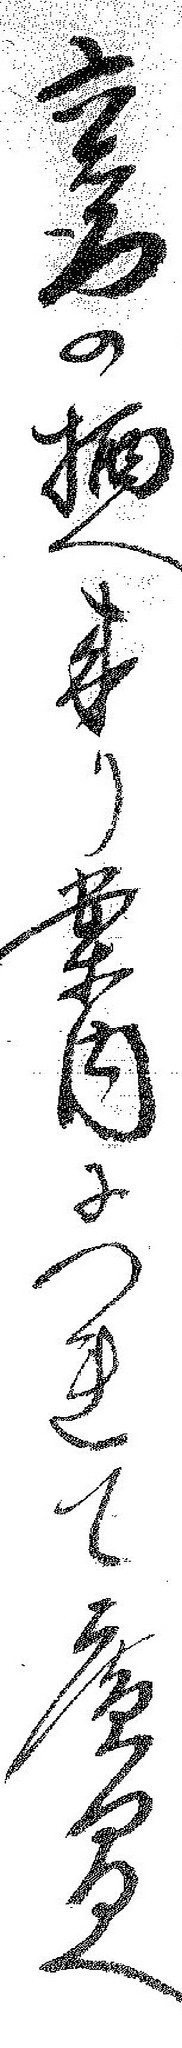六右衛門の栖へ来り案内につれて広間へ
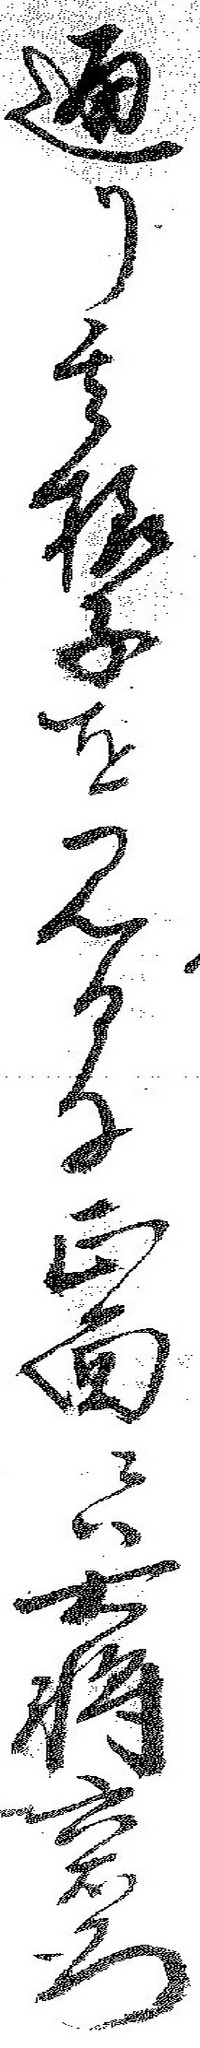通り其様子を見るに正面には大将六右衛門
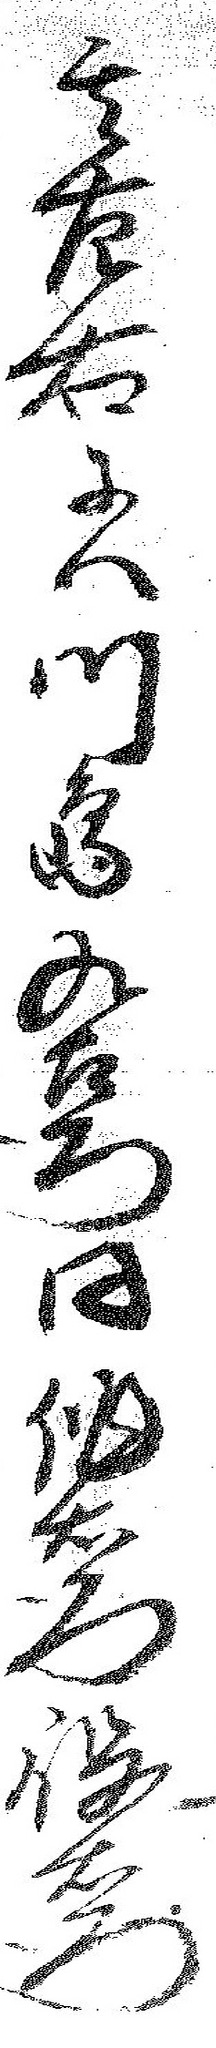其左右には川島九左衛門同作右衛門役右衛門
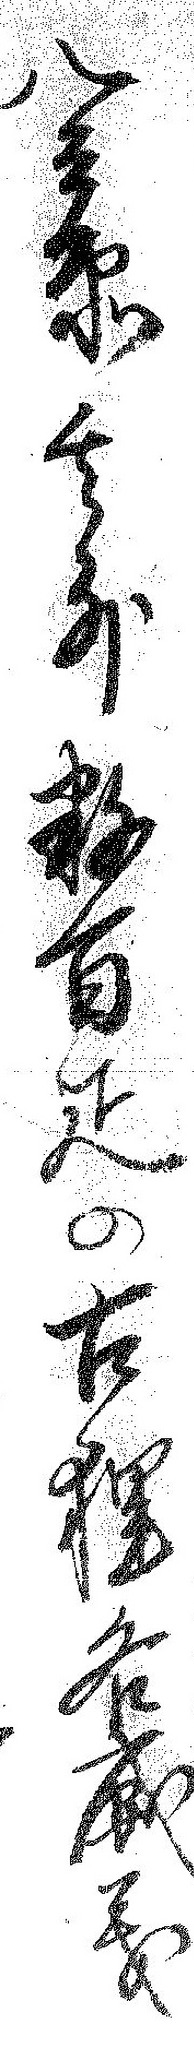八兵衛其外数百疋の古狸各威義
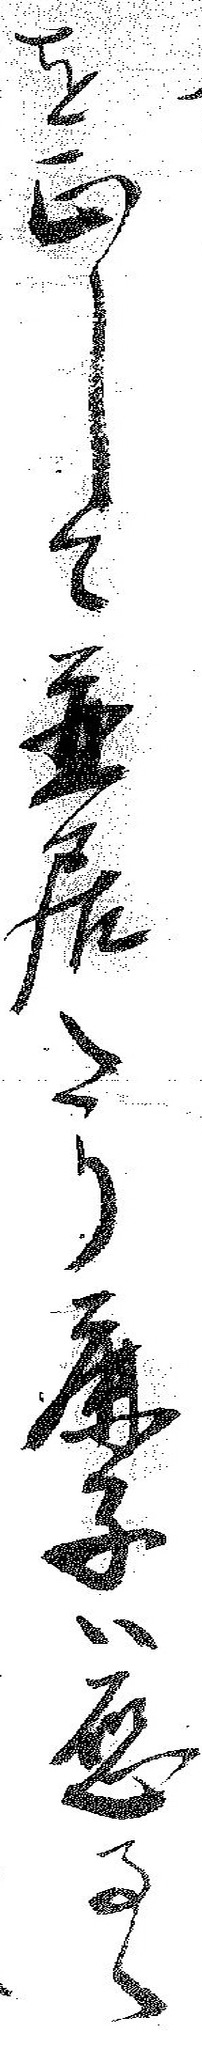を正して並居たり鹿子は恐るゝ
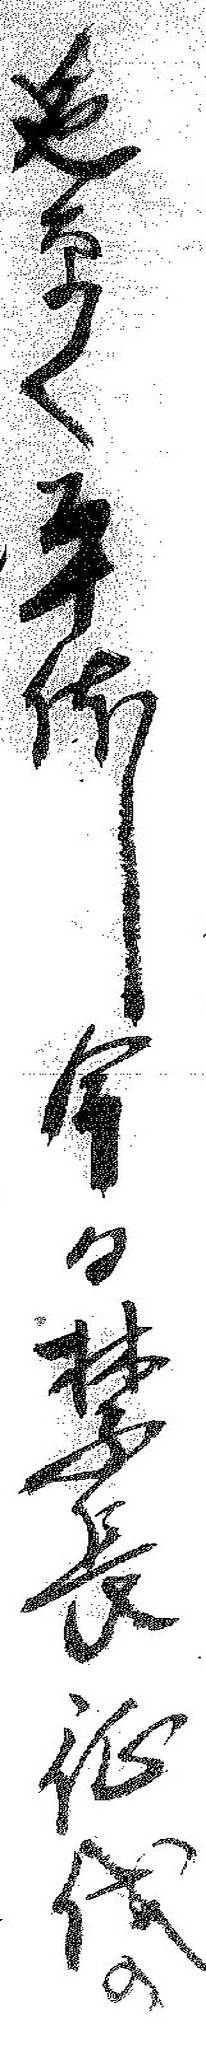色なく平伏し今日禁長征伐の
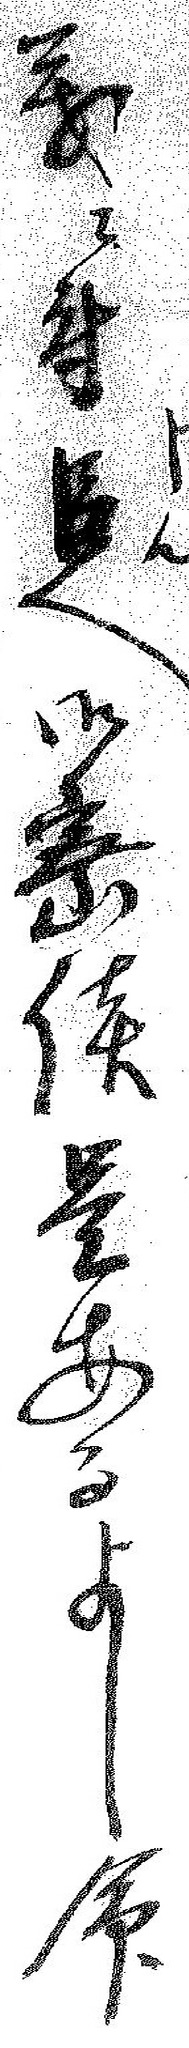義に付臣へ御密談是あるよし命
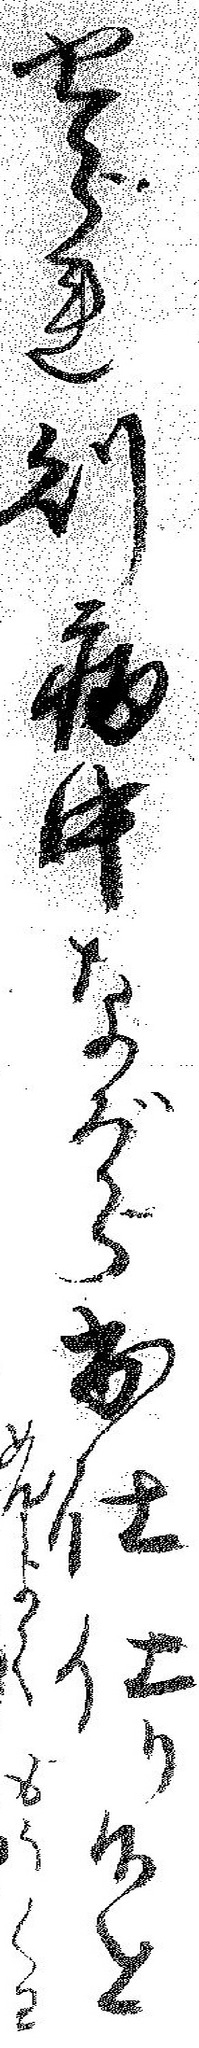せられ則病中ながら出仕仕り候と
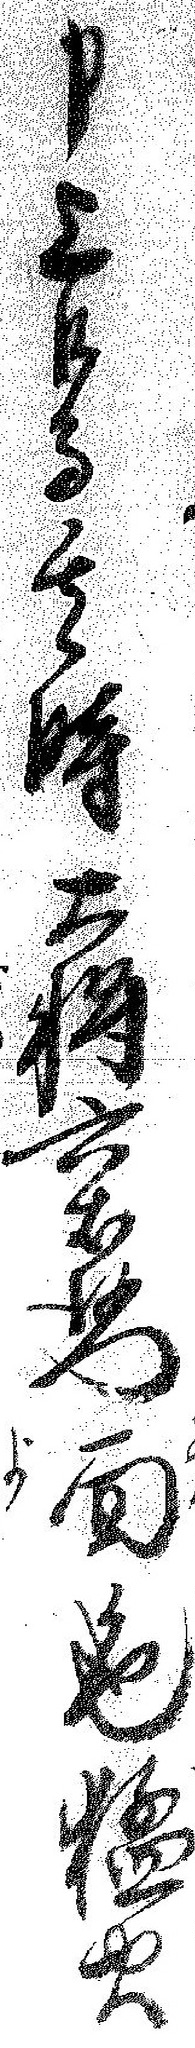申上ける其時大将六右衛門面色猛火
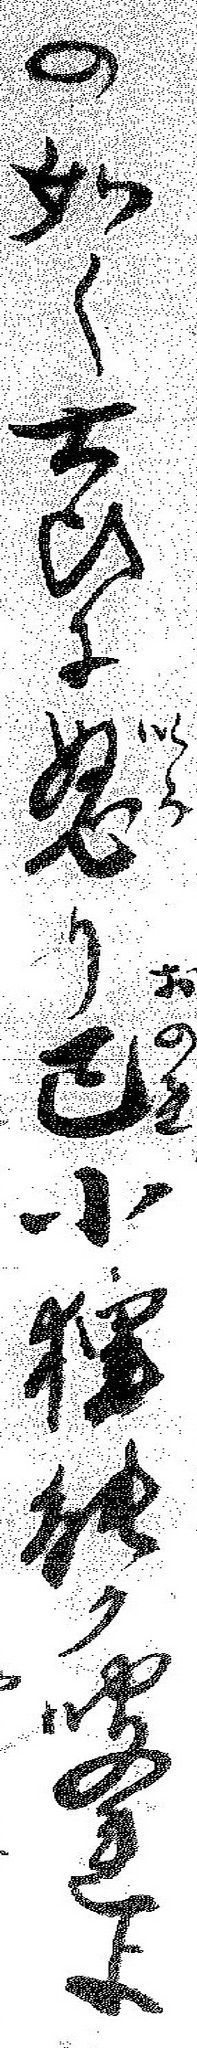の如く大ひに怒り己小狸能く聞れよ
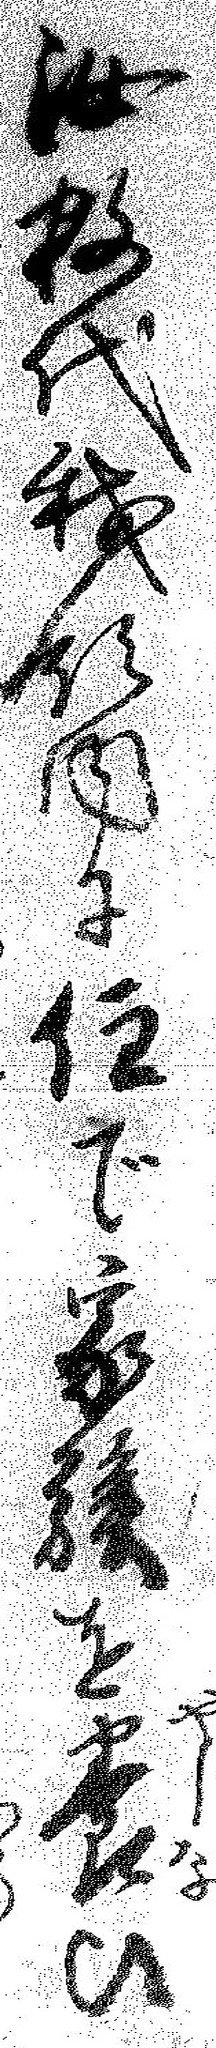汝数代我領内に住で家族を養ひ
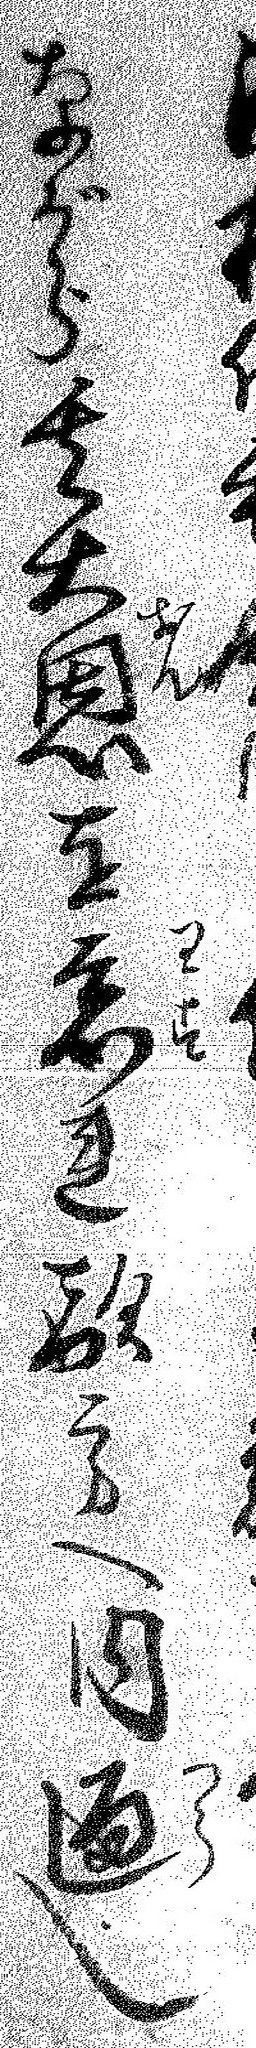ながら其大恩を忘れ敵方へ内通し

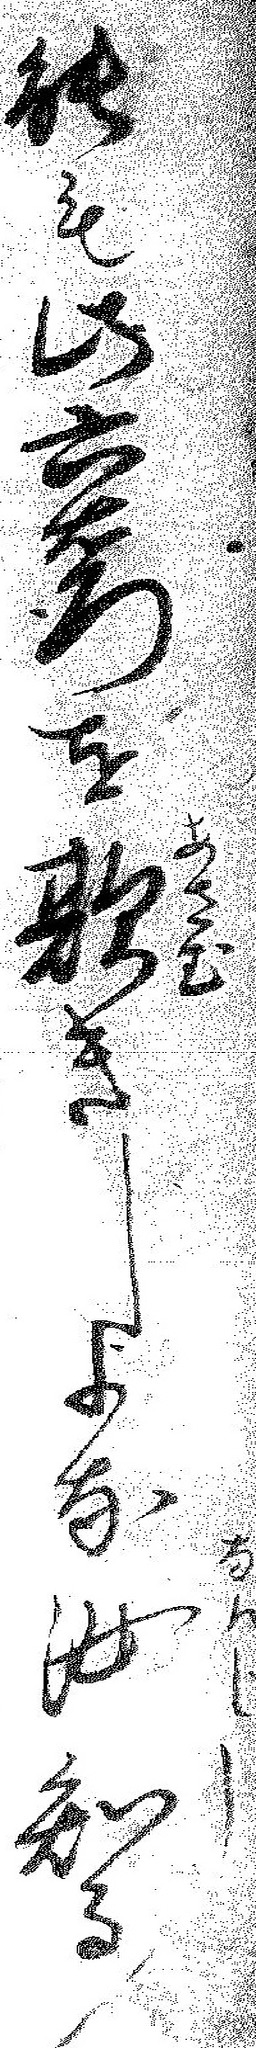能も此六右衛門を欺きしよな汝知る
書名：近頃古狸珍説　礼義智信
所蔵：徳島県立図書館
